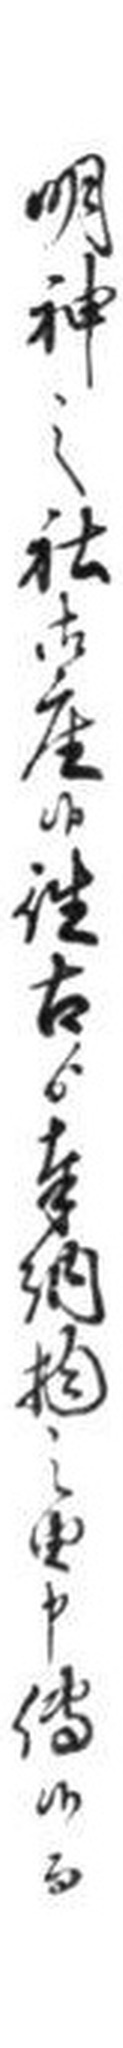明神之社御座候往古ゟ奉納者之由申伝候而
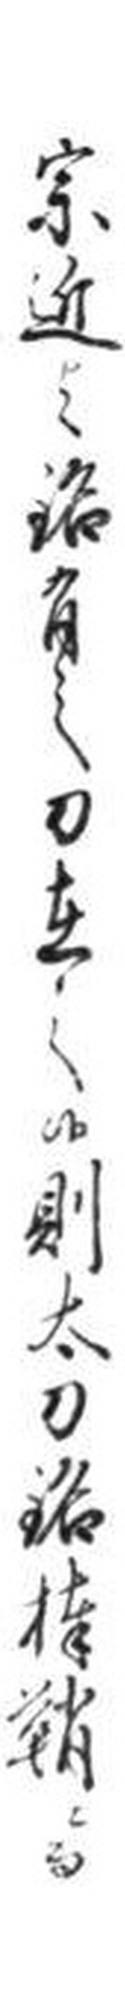宗近与銘有之刀在之候則太刀鍛冶棒鞘ニ而
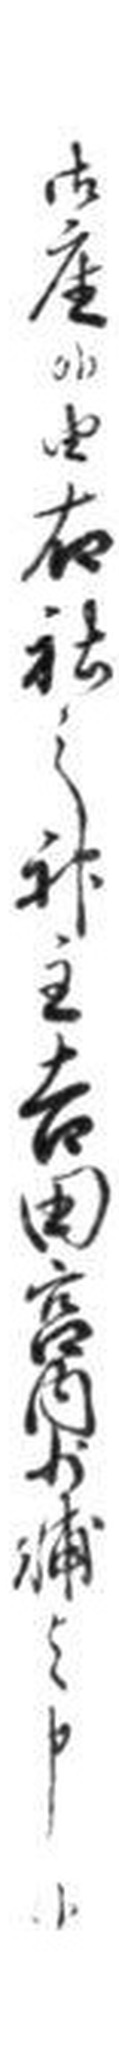御座候由右社之神主吉田宮内少輔与申候
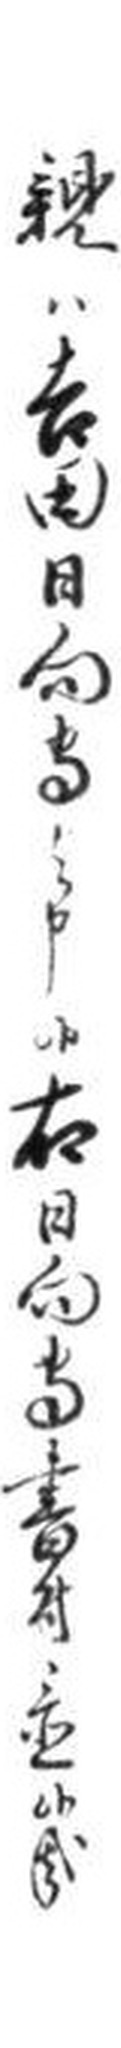親ハ吉田日向守与申候右日向守書付置候哉
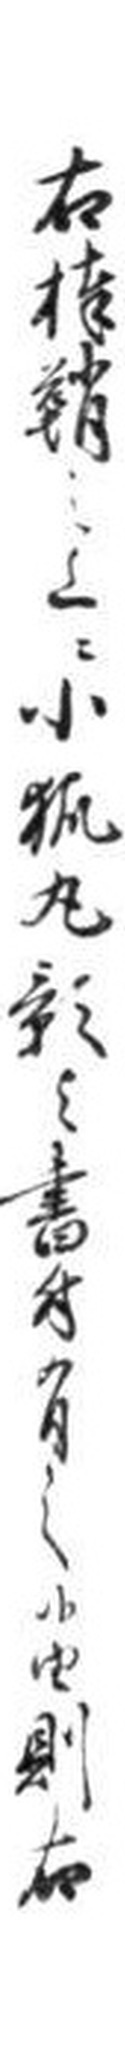右棒鞘之上ニ小狐丸彰与書付有之候由則右
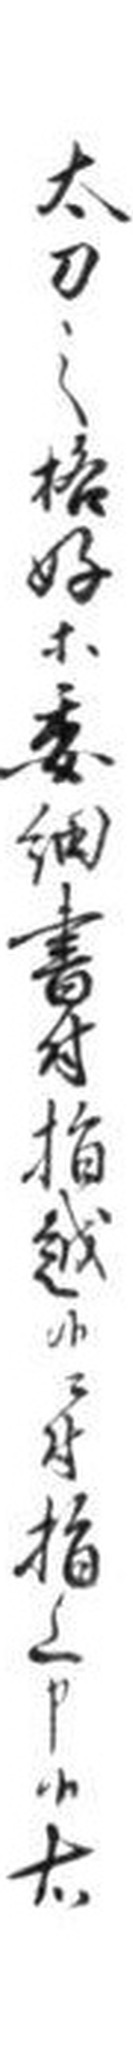太刀之格好等委細書付指越候ニ付指上申候右
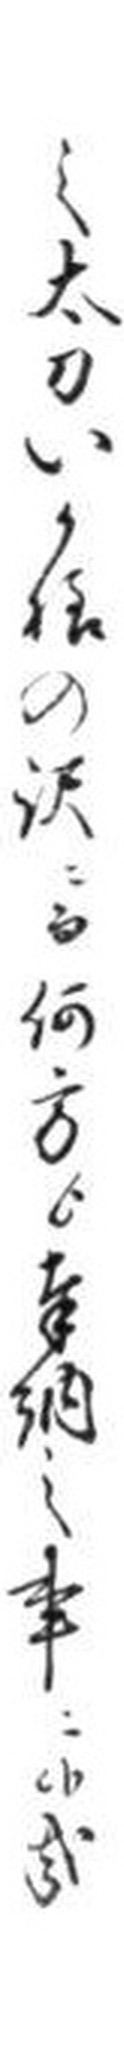之太刀いか様の訳ニ而何方ゟ奉納之事ニ候哉
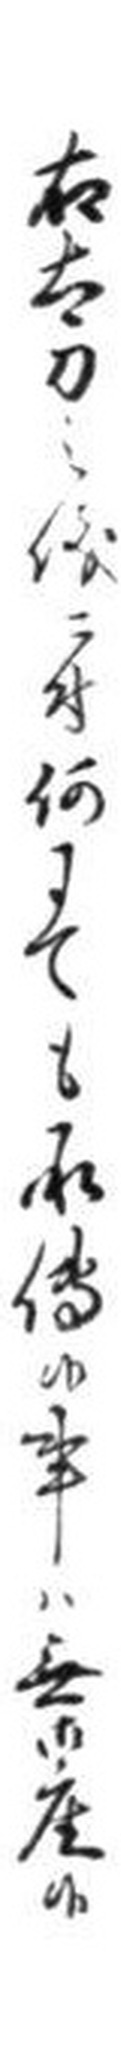右太刀之儀ニ付何にても承伝候事ハ無御座候
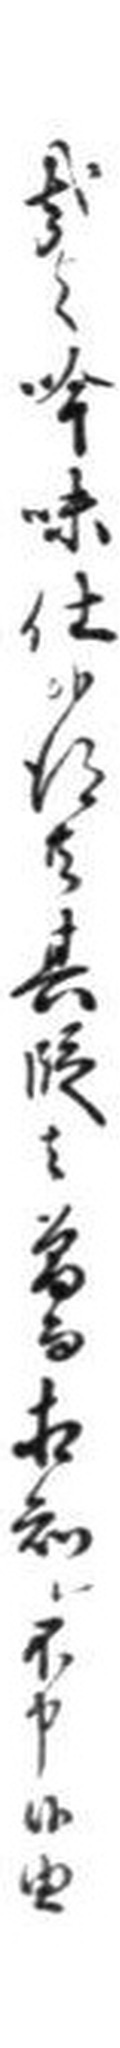哉与吟味仕候得共其段者曽而相知レ不申候由
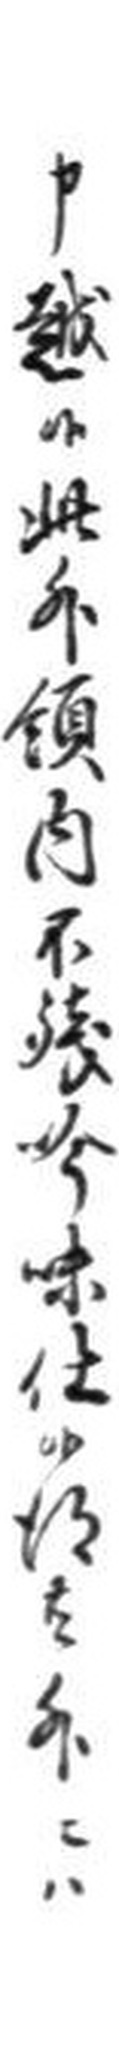申越候此外領内不残吟味仕候江共外ニハ
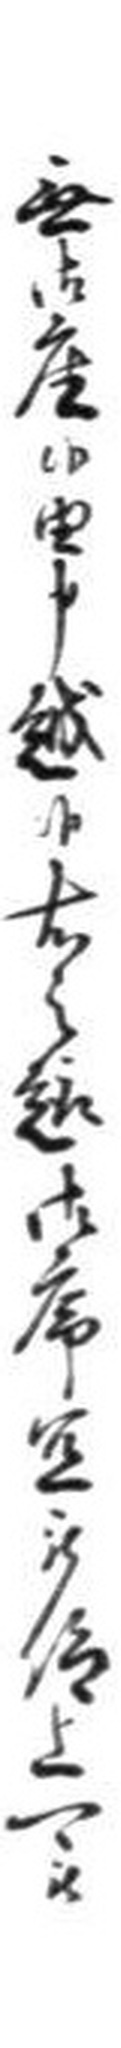無御座候由申越候右之趣御序宜被仰上可被
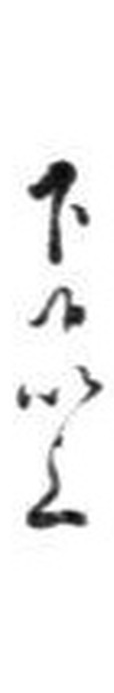下候以上
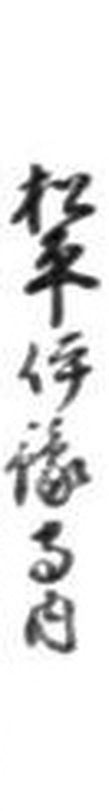松平伊予守内
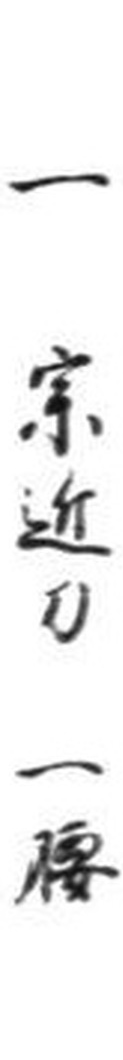一宗近刀一腰
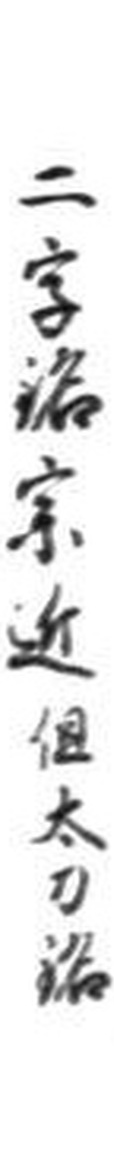二字銘宗近但太刀銘
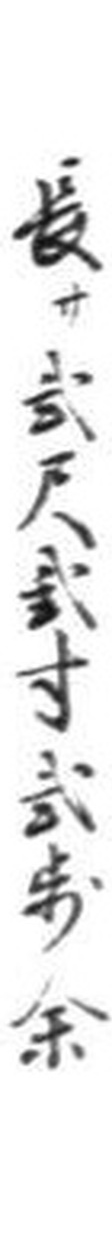長サ弐尺弐寸弐歩余
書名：家譜 三十四 吉邦公 従享保五年到同六年
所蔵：福井県文書館 Fukui Prefectural Archives
